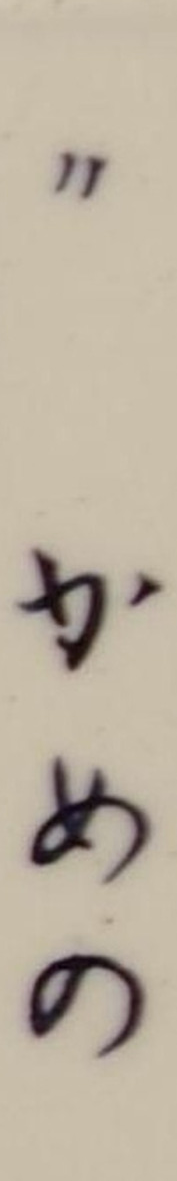かめの
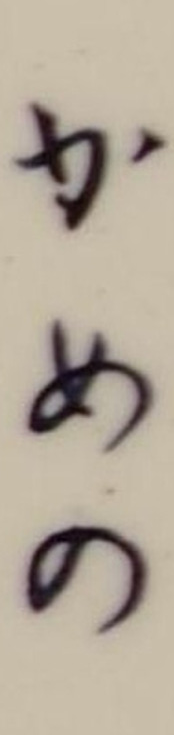かめの
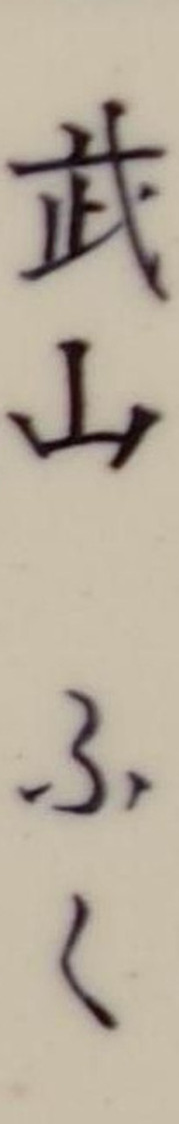武山ふく
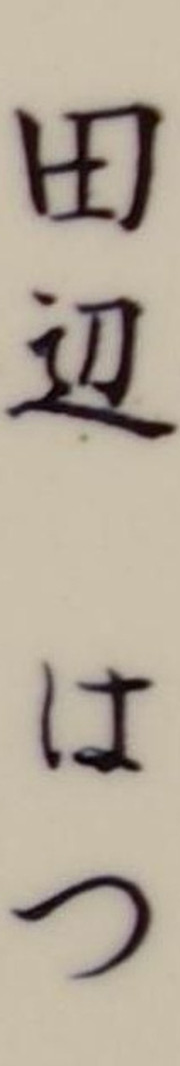田辺はつ
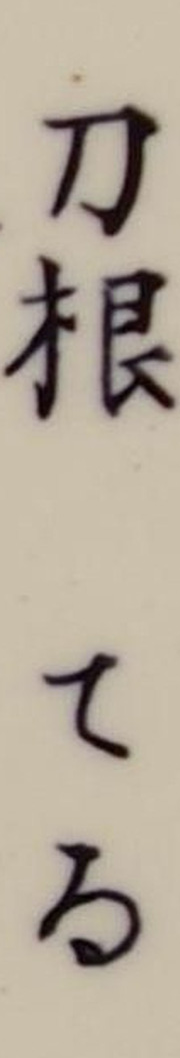刀根てる
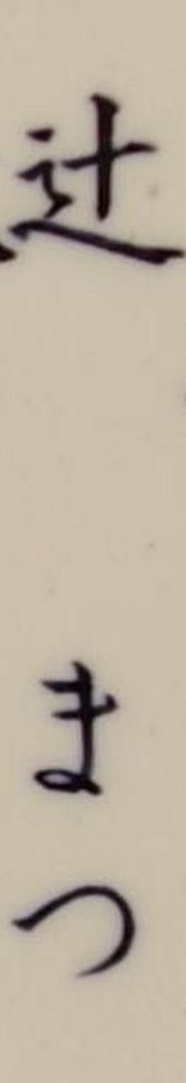辻まつ
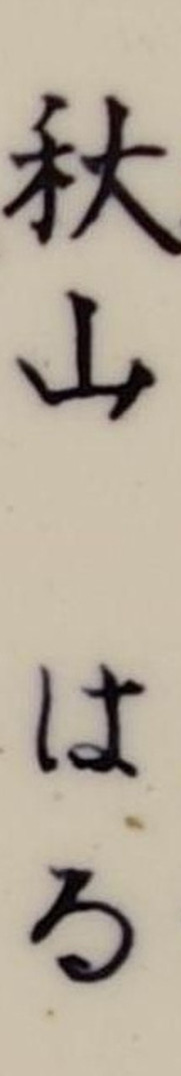秋山はる
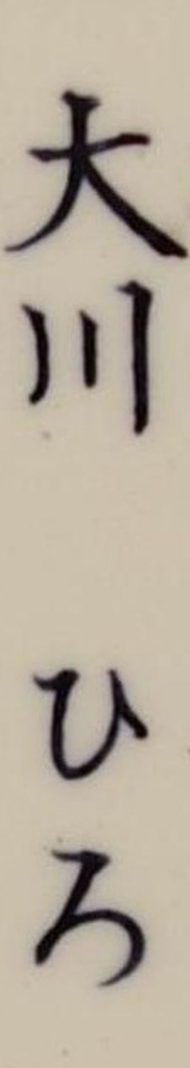大川ひろ
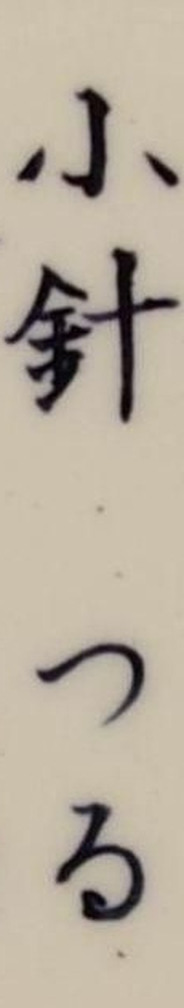小針つる
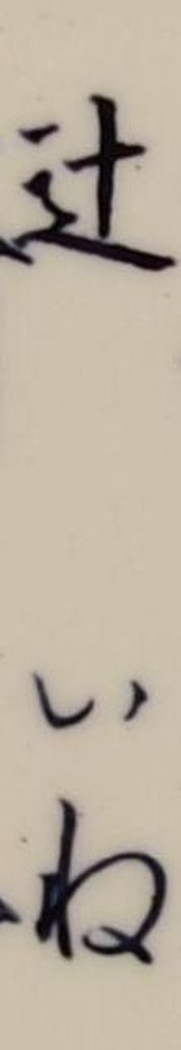辻いね
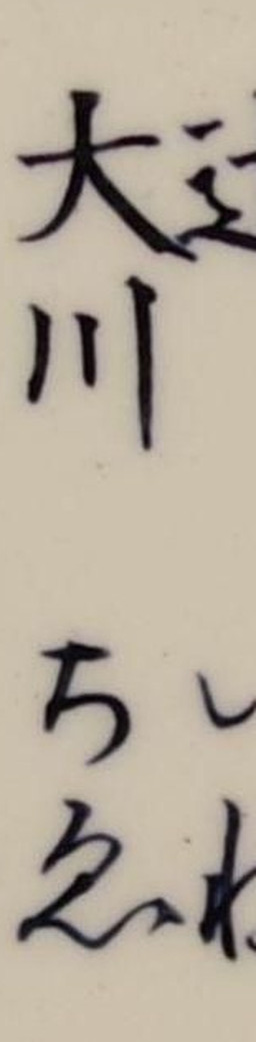大川ちゑ
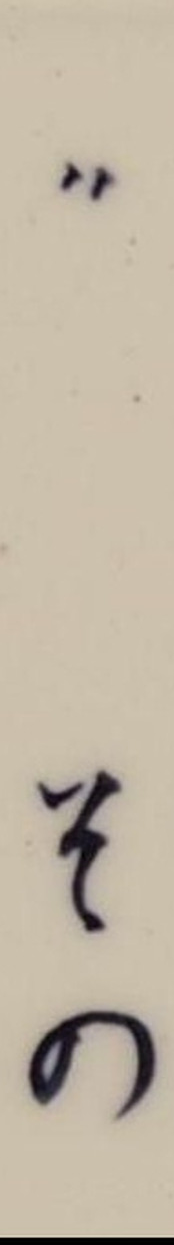かめの
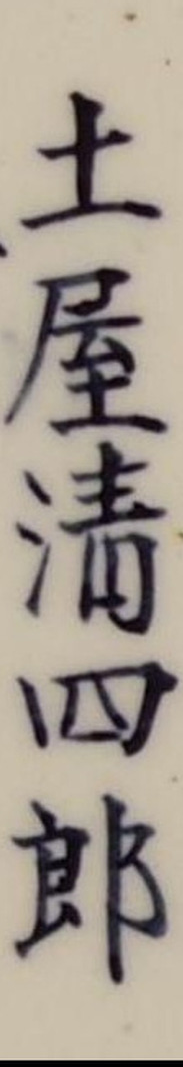土屋清四郎
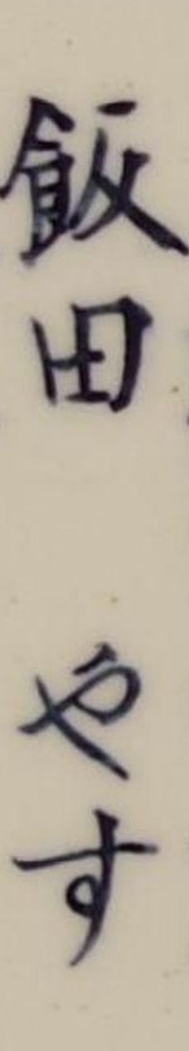飯田やす
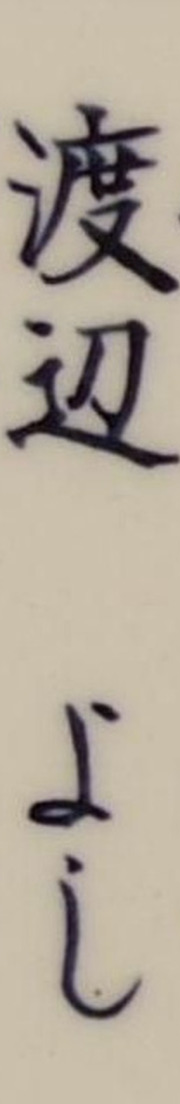渡辺よし
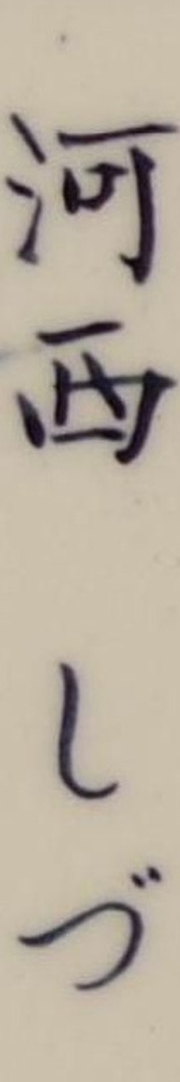河西しづ
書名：E~L
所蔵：高野山金剛峯寺
